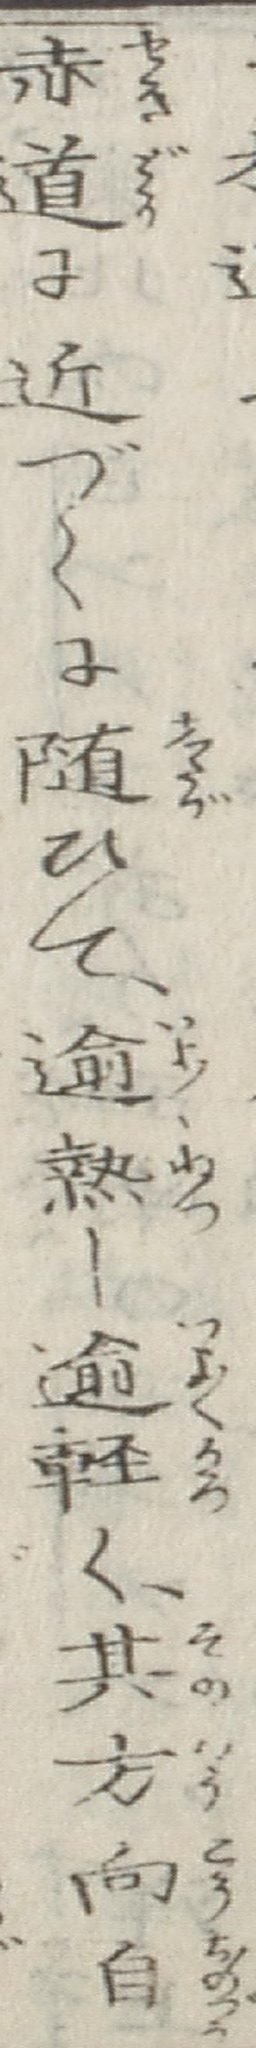赤道に近づくに随ひて、愈熱し愈軽く、其方向自
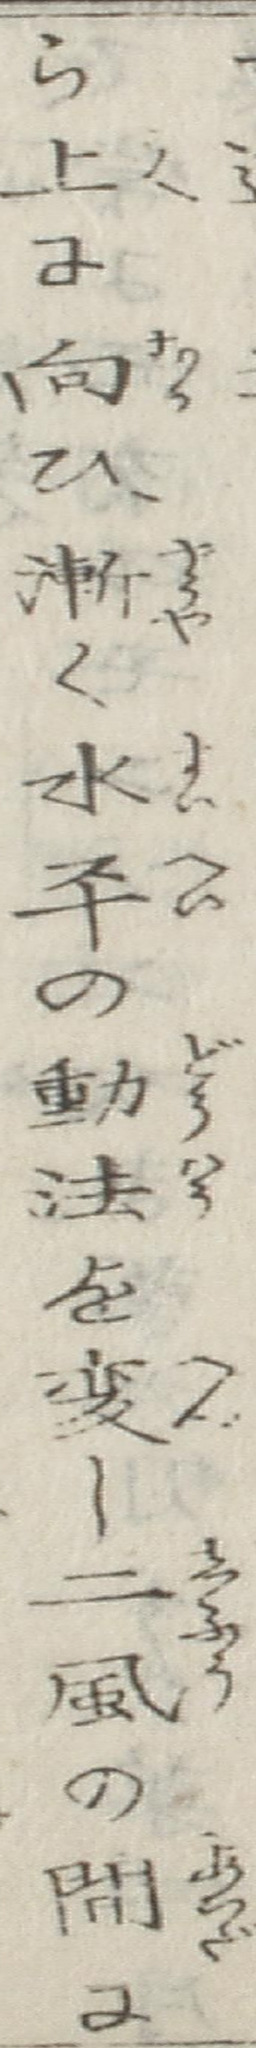ら上に向ひ漸く水平の動法を変し二風の間に
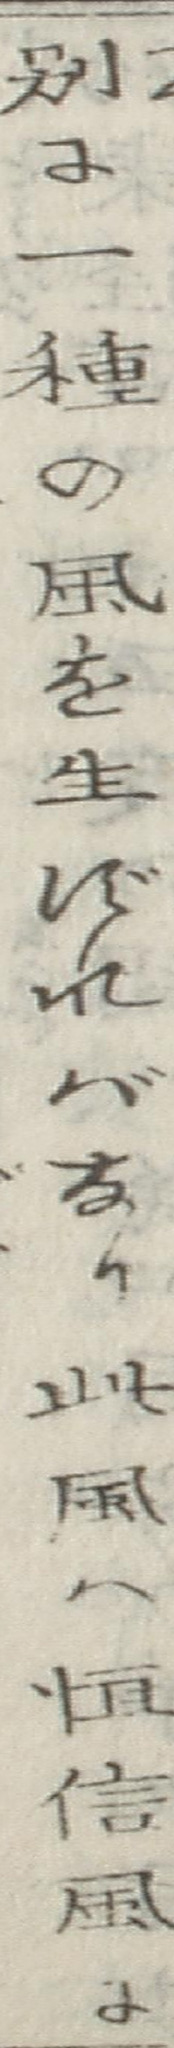別に一種の風を生ずればなり此風は恒信風に
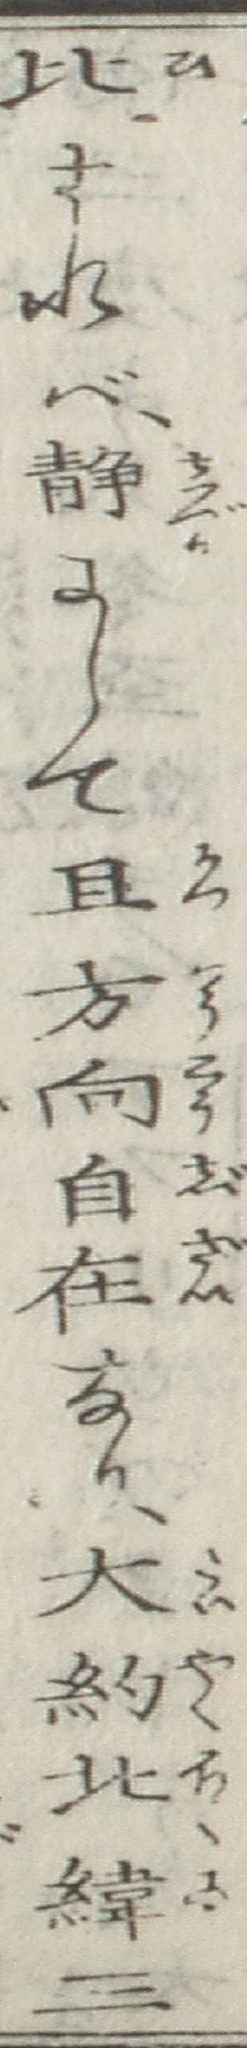比すれば、静にして且方向自在なり、大約北緯三
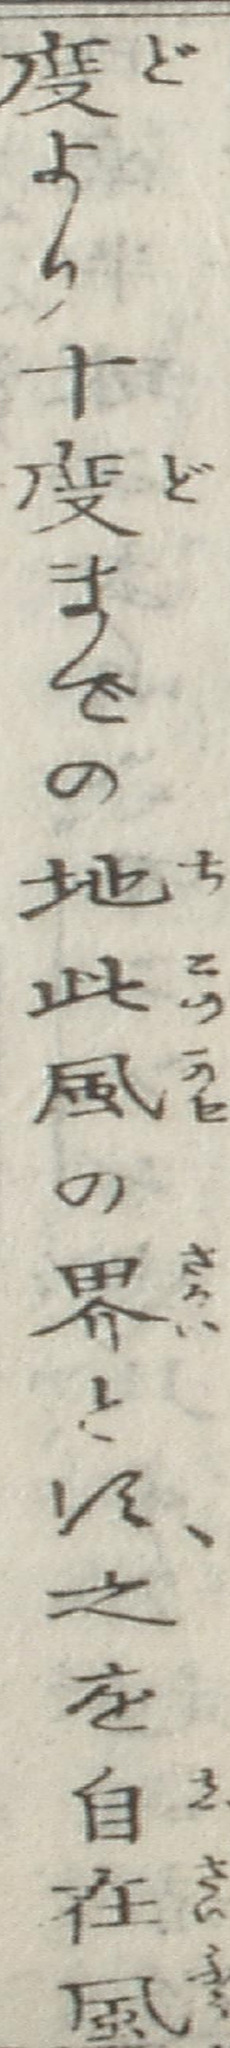度より十度までの地此風の界とす、之を自在風
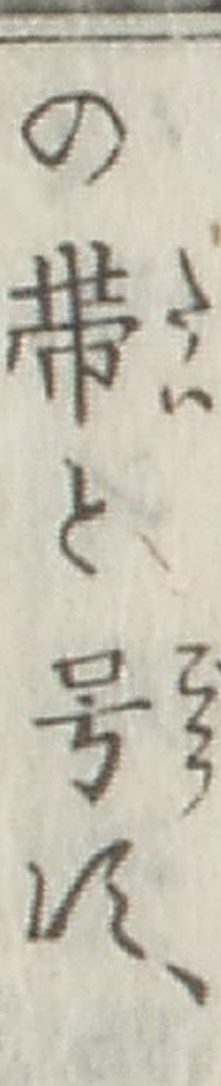の帯と号す、
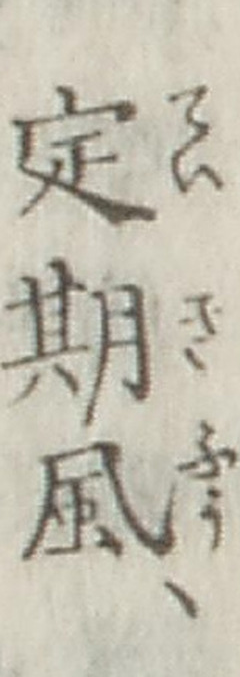定期風、
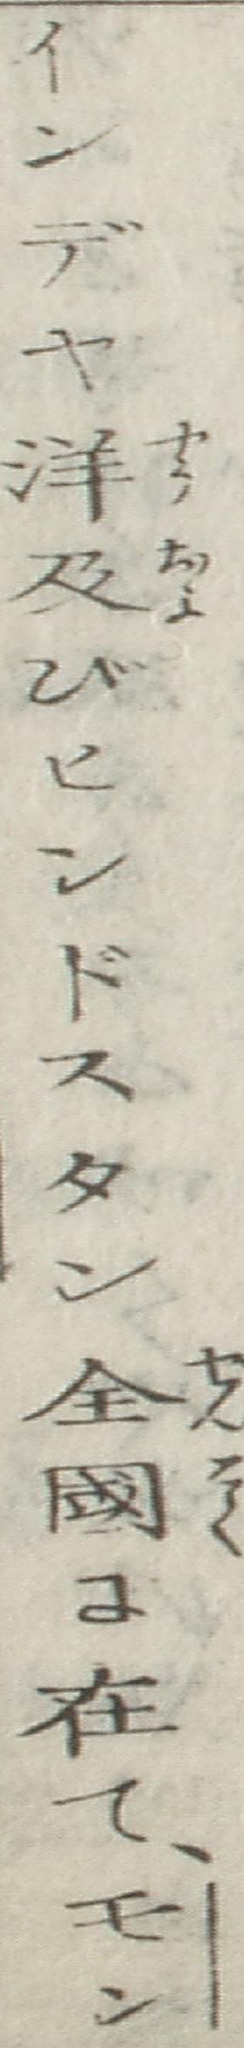インデヤ洋及びヒンドスタン全国に在て、モン

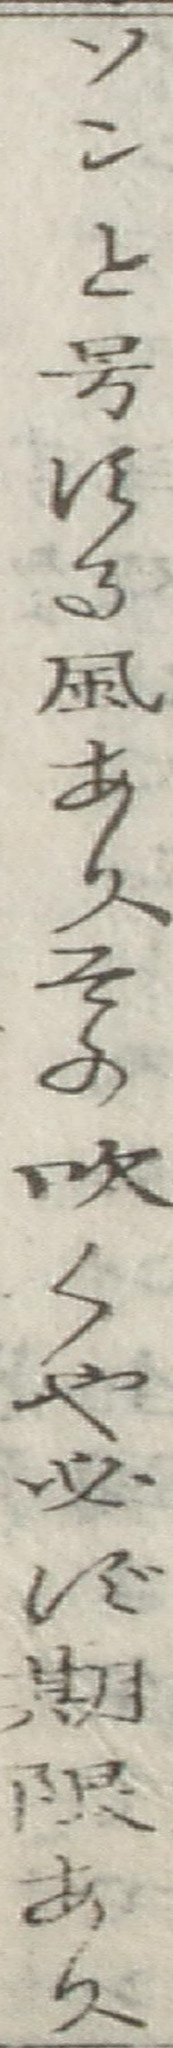ソンと号する風あり、その吹くや必ず期限あり、
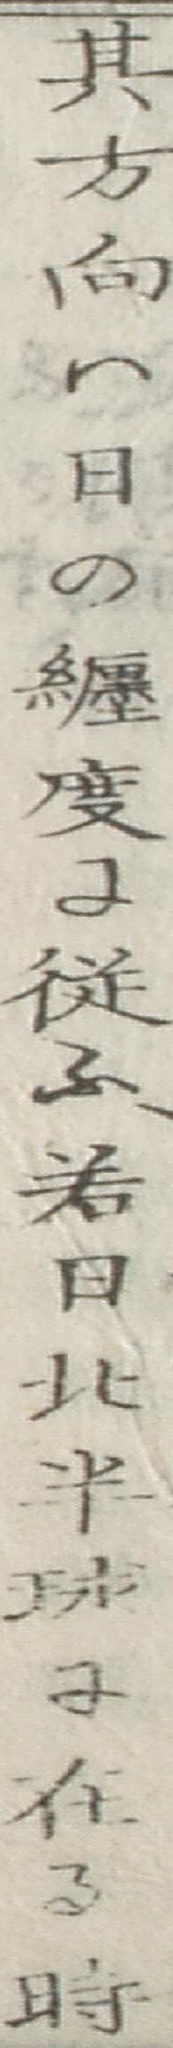其方向は日の纏度に従ふ、若北半球に在る時
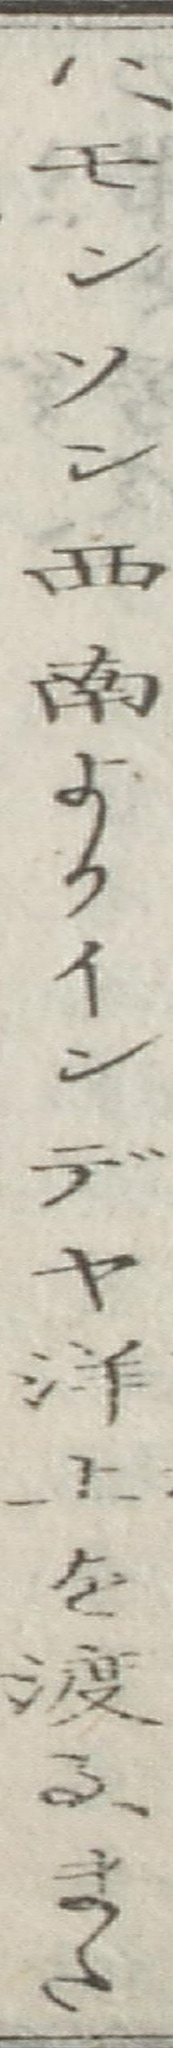は、モンソン西南よりインデヤ洋上を渡る、また
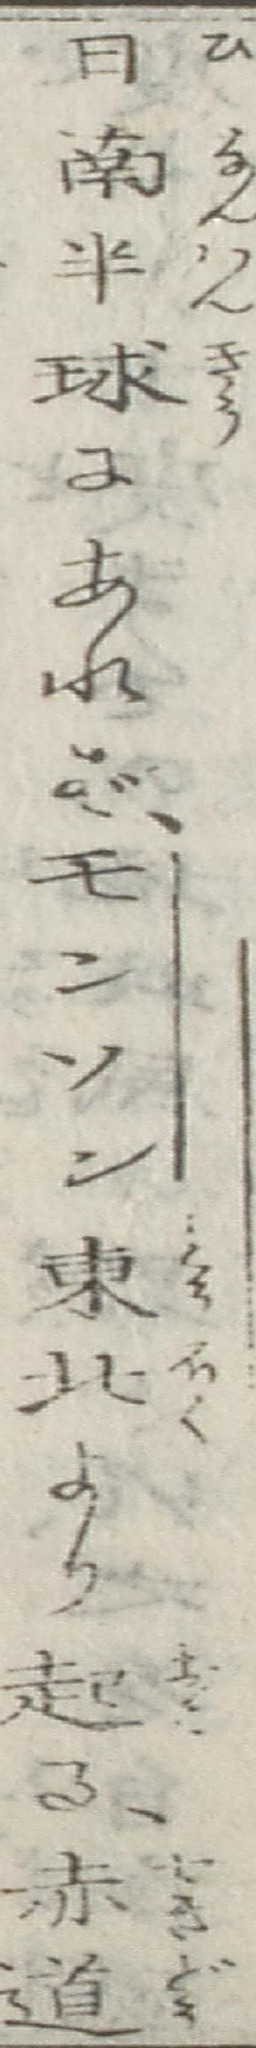日南半球にあれば、モンソン東北より起る、赤道
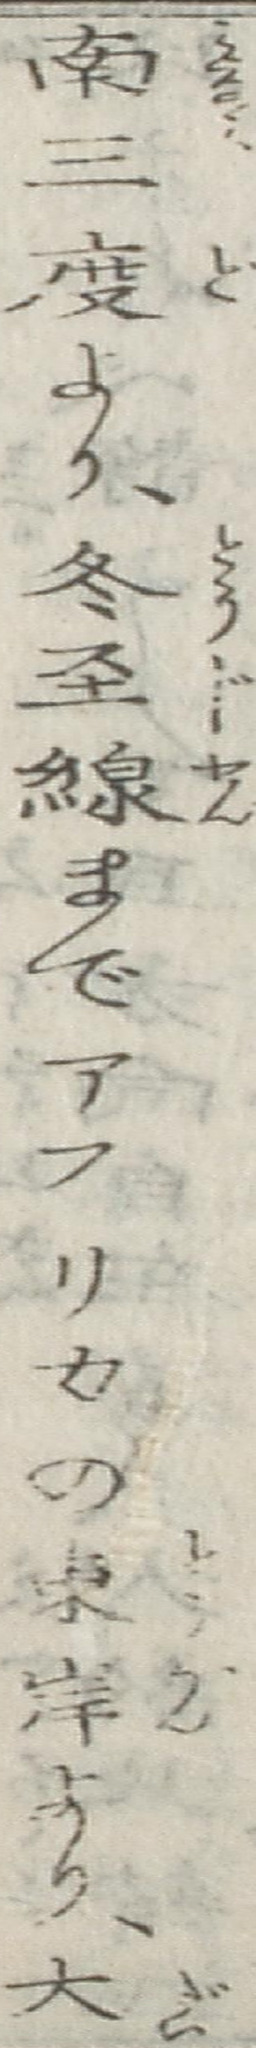南三度より、冬至線までアフリカの東岸より、大
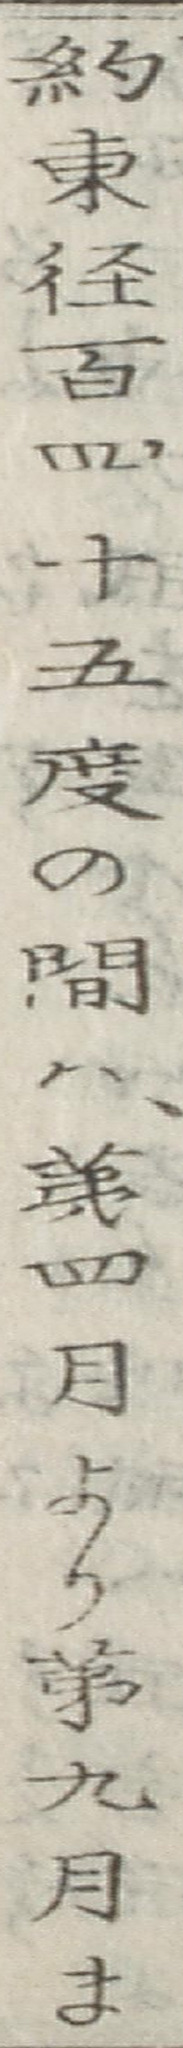約東経百四十五度の間は、第四月より第九月ま
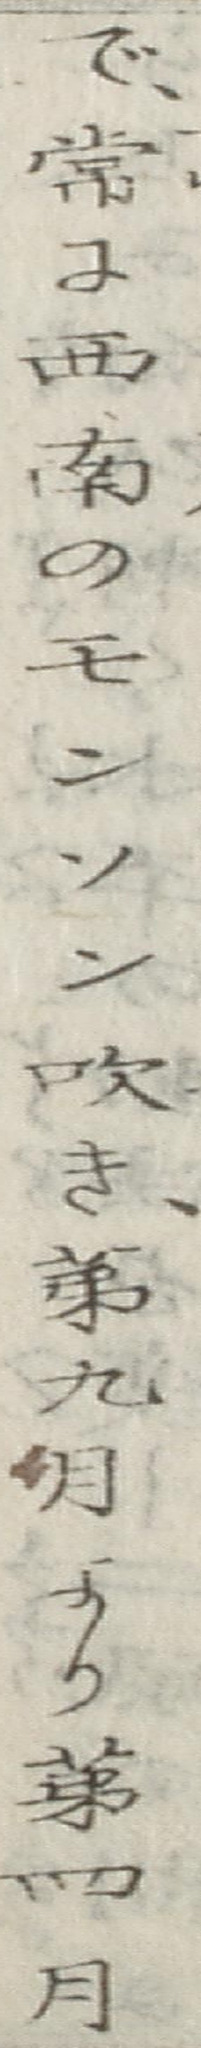で、常に西南のモンソン吹き、第九月より第四月
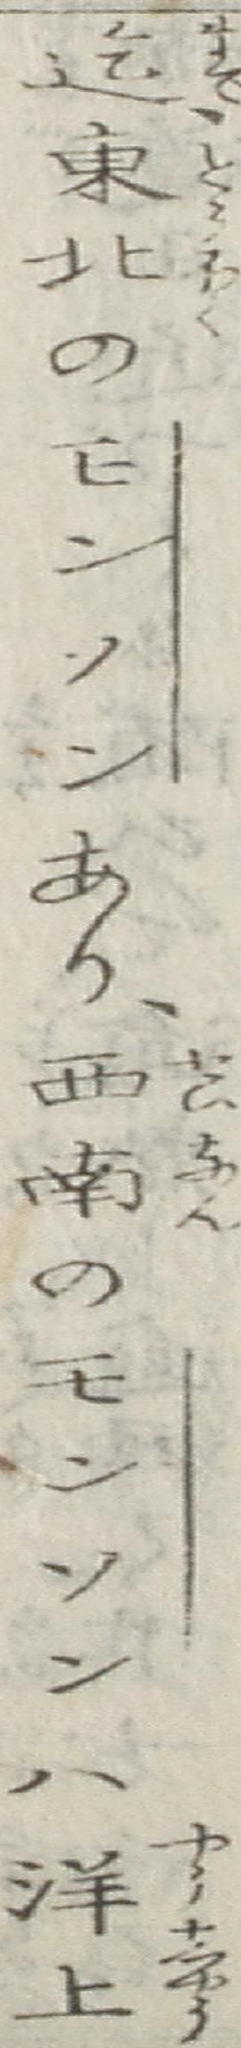迄、東北のモンソンあり、西南のモンソンは洋上
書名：訓蒙　天然地理學　中
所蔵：東京大学地震研究所図書室 Earthquake Research Institute Library, The University of Tokyo, JAPAN
